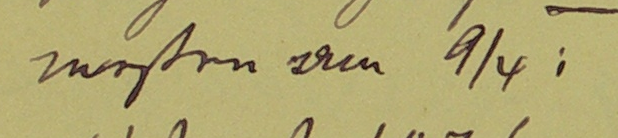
meßen am 9/4
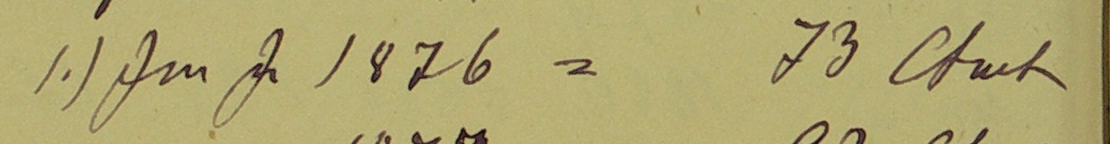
1) Im Jahre 1876 = 73 cmtr
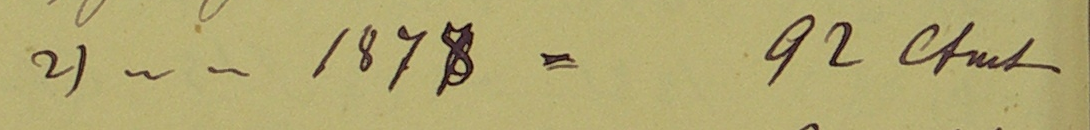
2) 1878 = 92 cmtr
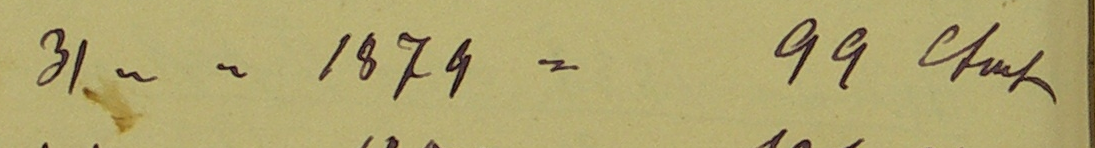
3) 1879 = 99 cmtr
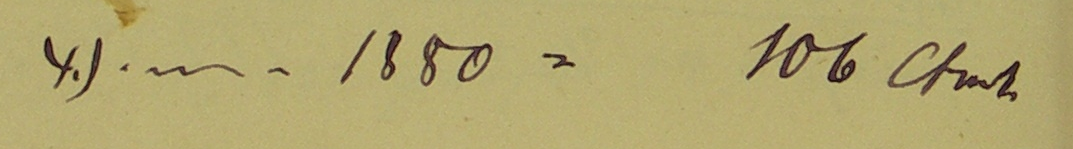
4) 1880 = 106 cmtr
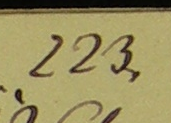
223
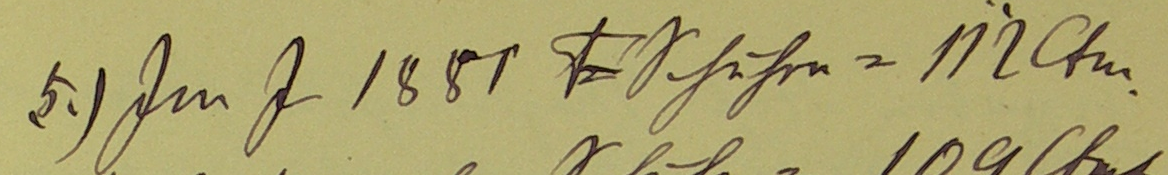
5) 1881 = mit Schuhen 112 cmtr
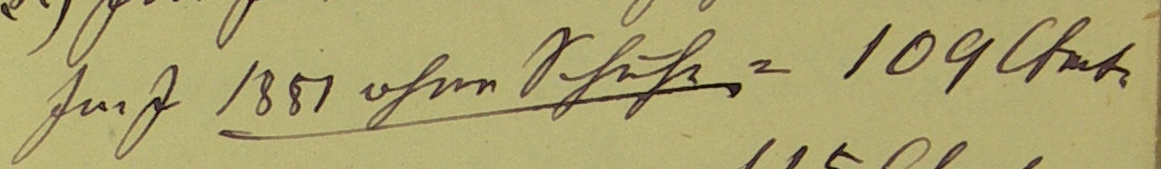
1881 = ohne Schuhe 109 cmtr
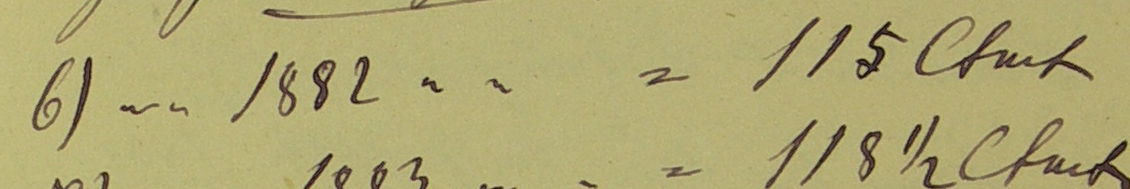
6) 1882 = 115 cmtr
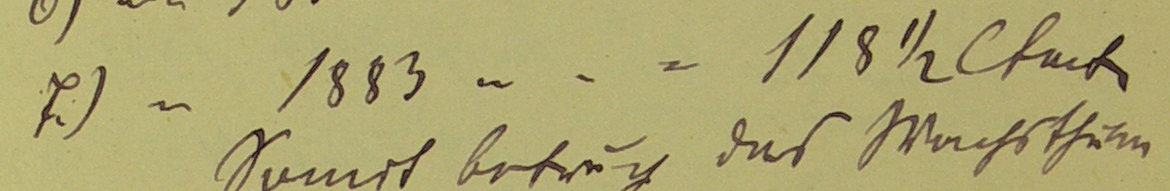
7) 1883 = 118 ½ cmtr
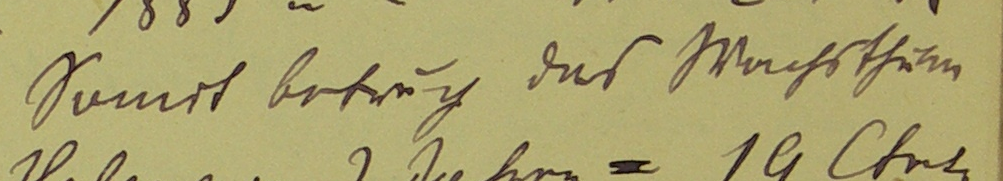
Somit betrug das Wachstum
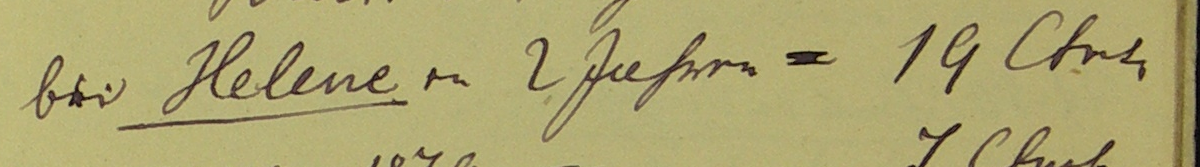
bei Helene in 2 Jahren = 19 cmtr
